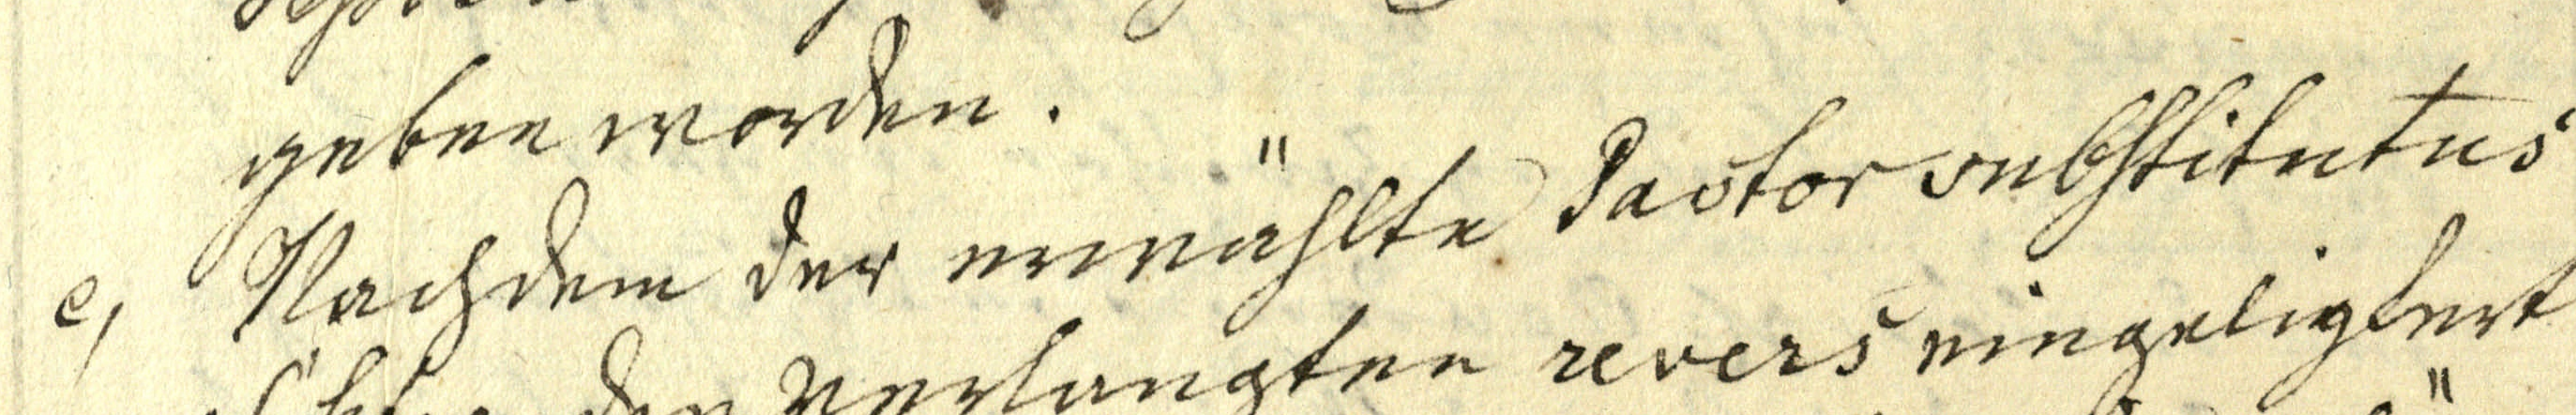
e, Nachdem der erwählte Pastor substitutus
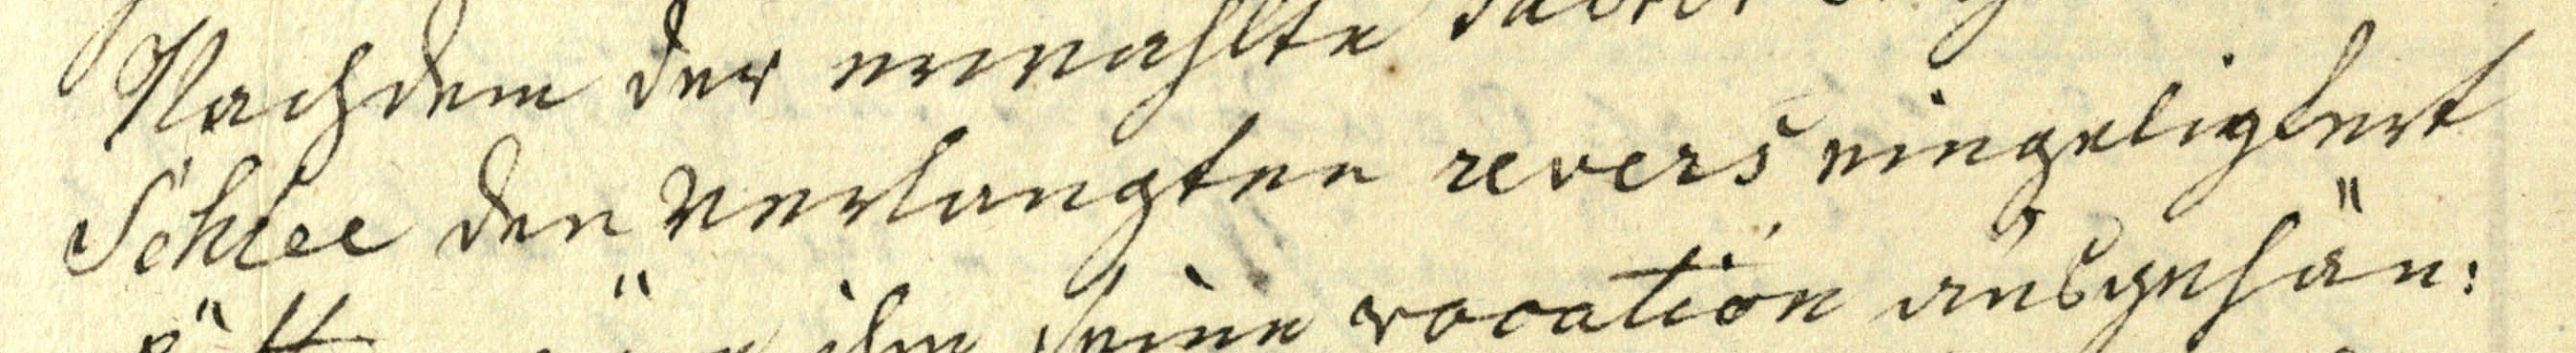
Schlee den verlangten revers eingeliefert
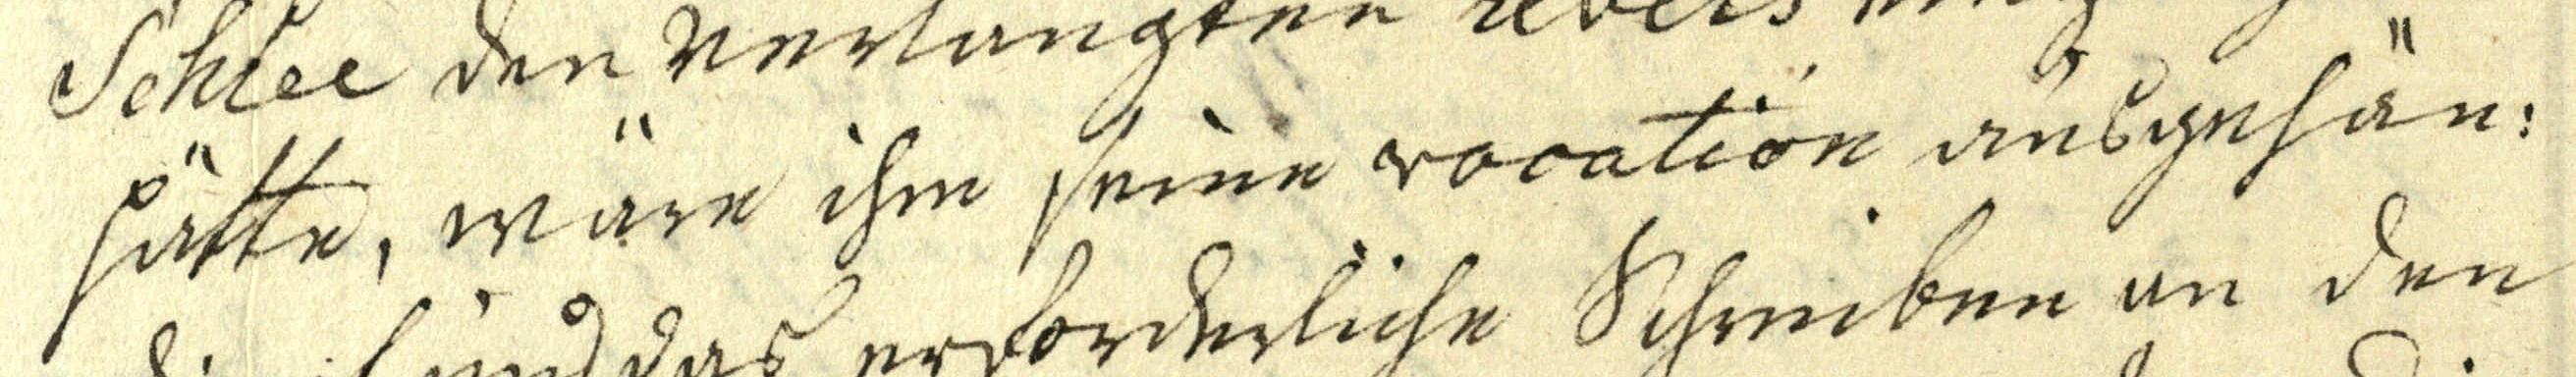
hätte, wäre ihm seine vocation ausgehän¬
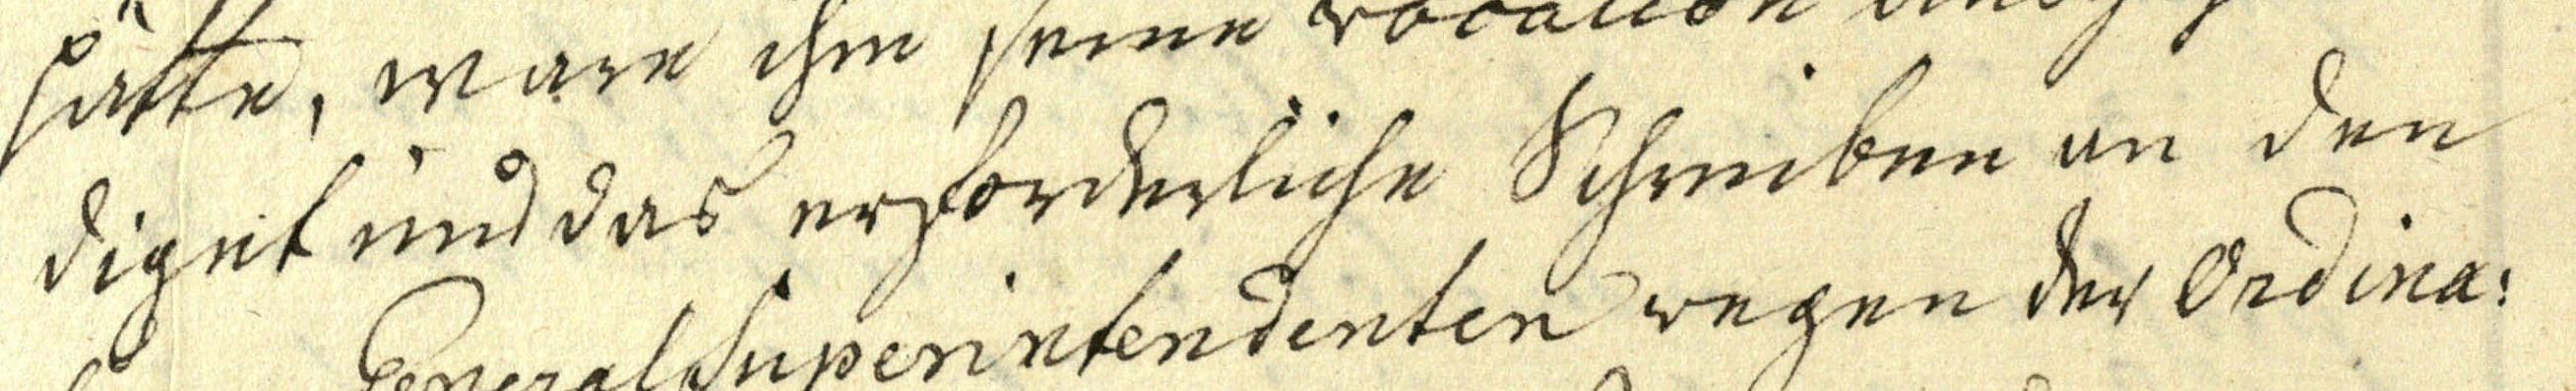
digt und das erforderliche Schreiben an den
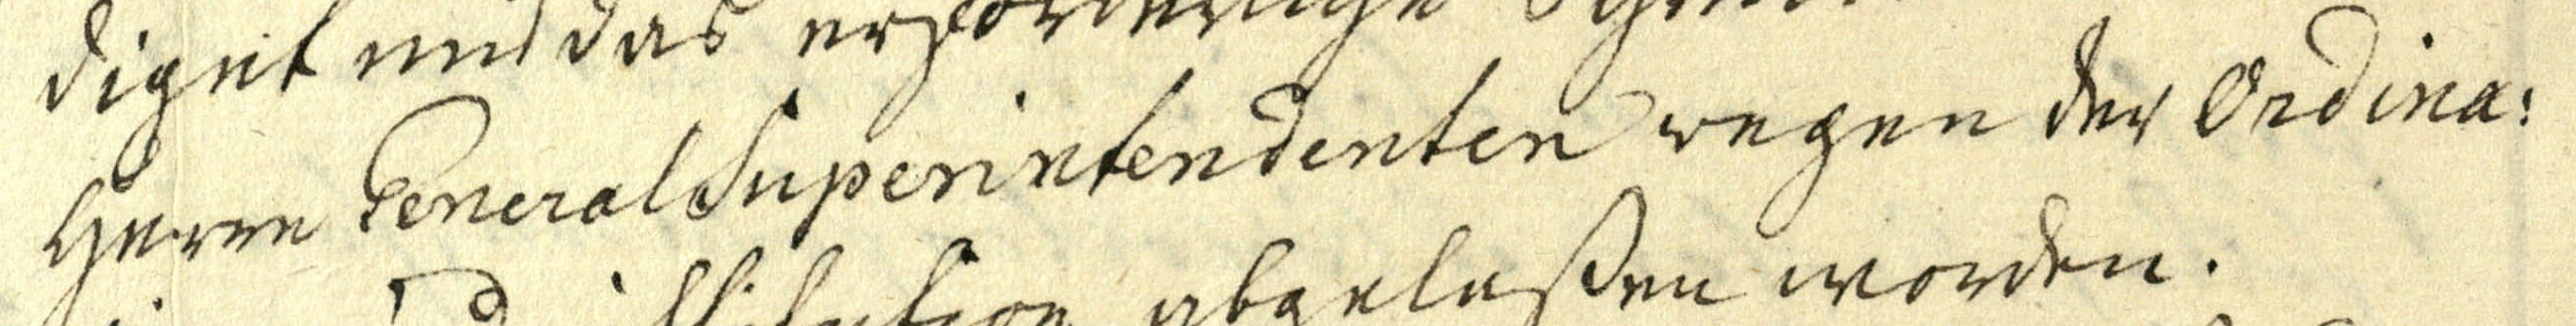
Herrn GeneralSuperintendenten wegen der Ordina¬
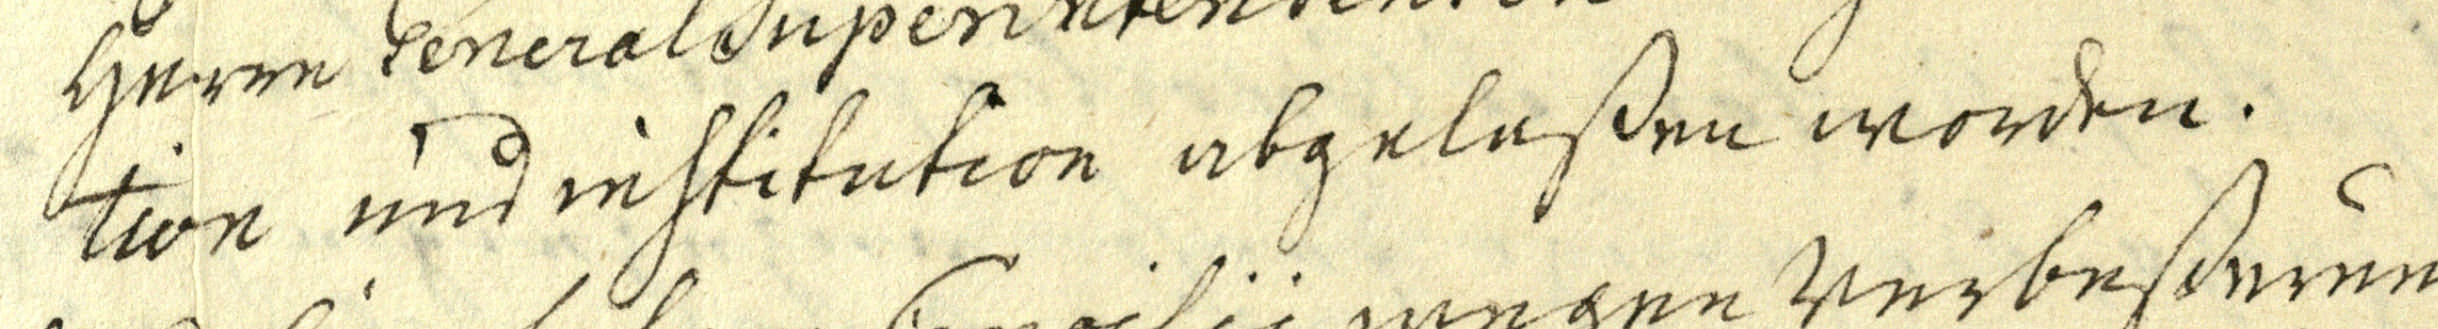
tion und institution abgelaßen worden.
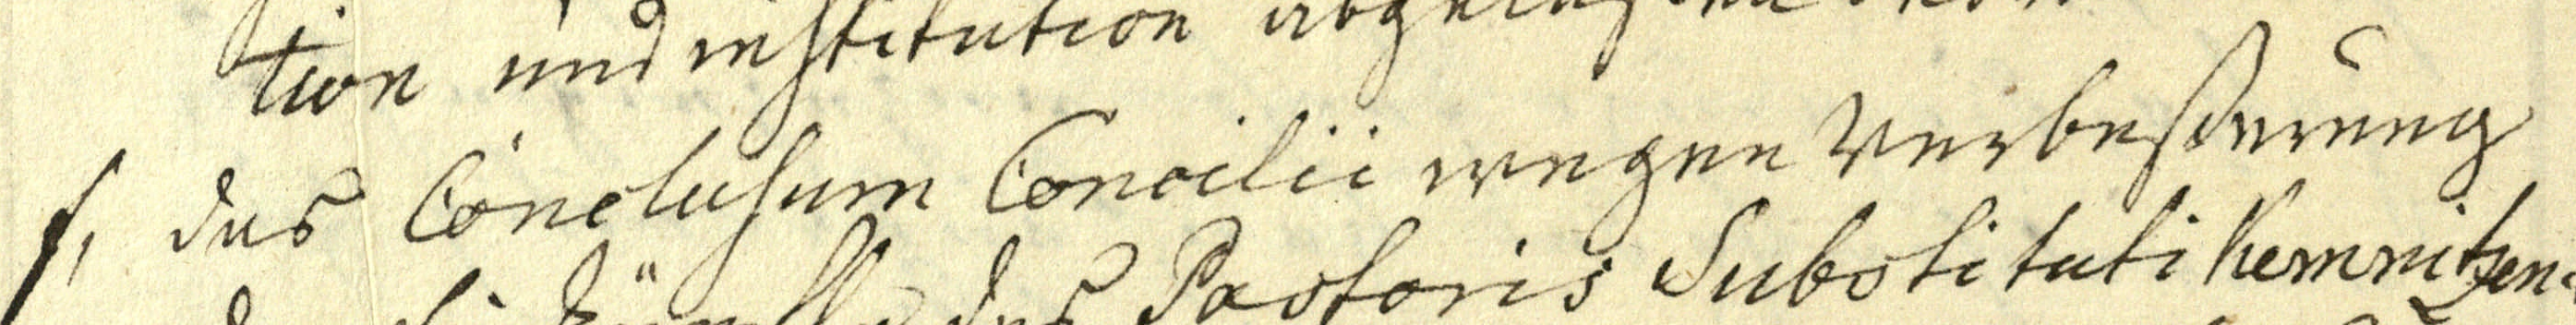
f, das Conclusum Concilii wegen Verbeßerung
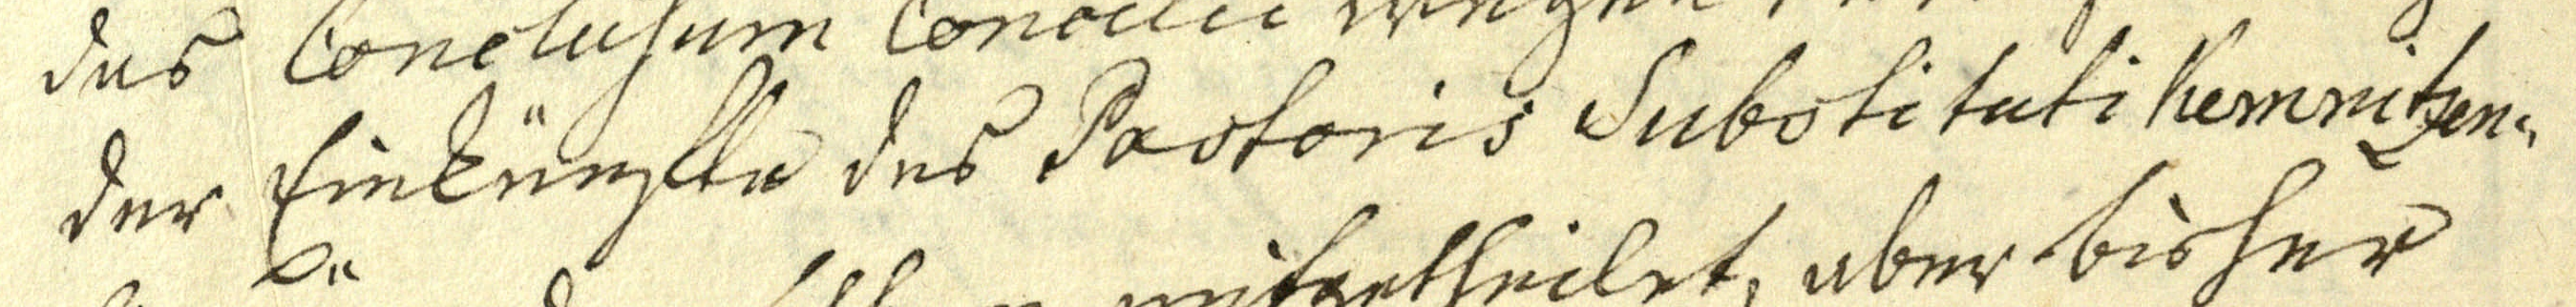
der Einkünfte des Pastoris Substituti Kemnitzen¬
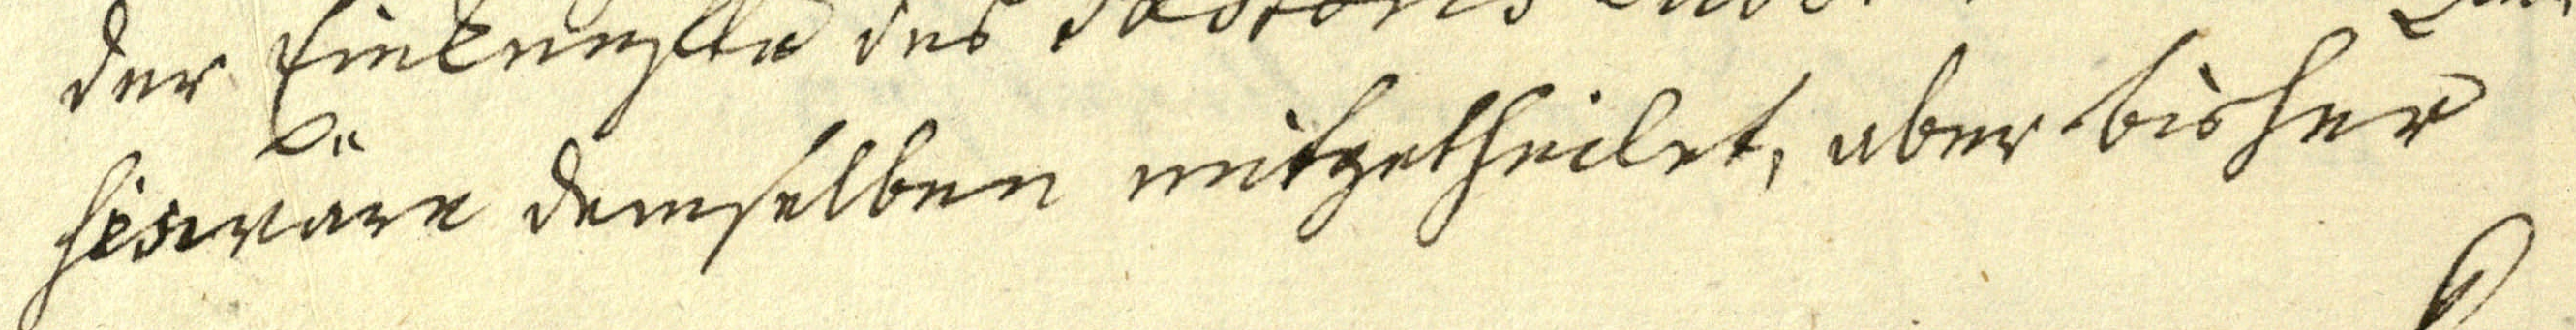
sis wäre demselben mitgetheilet, aber bisher
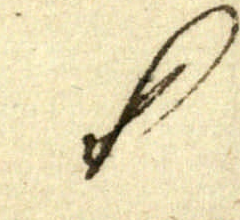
k
